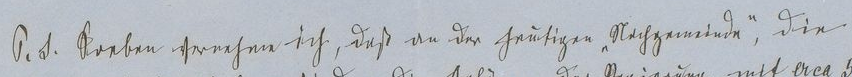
P. S. Soeben vernehme ich, daß an der heutigen «Nachgemeinde», die
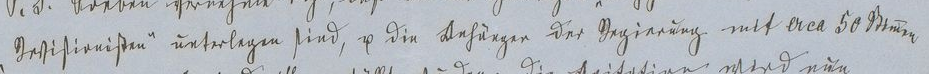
«Revisionisten» unterlegen sind, & die Anhänger der Regierung mit circa 50 Stimmen
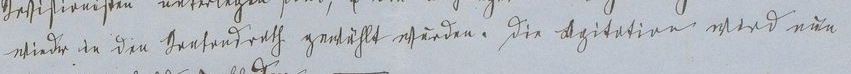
wieder in den Kantonsrath gewählt wurden. Die Agitation wird nun
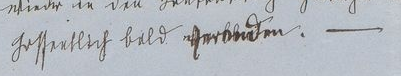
hoffentlich bald verenden. –
